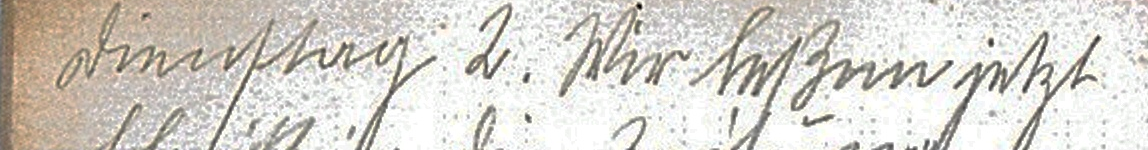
Dienstag 2. Wir leßen jetzt
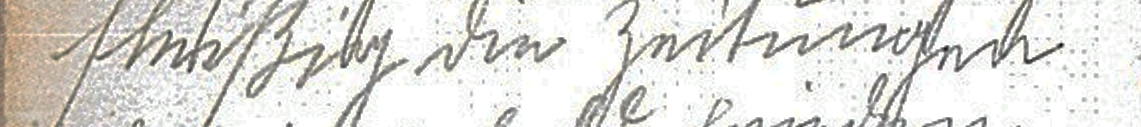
fleißig die Zeitungen
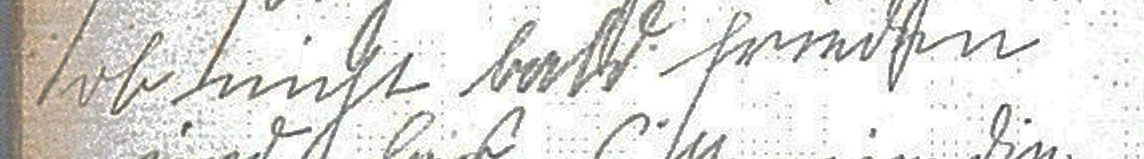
ob nicht bald Frieden
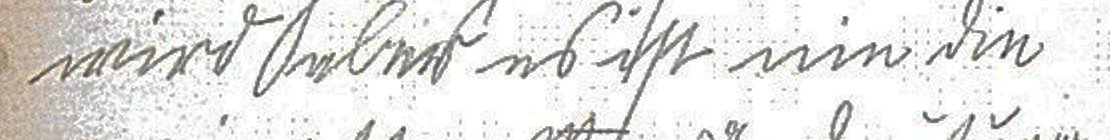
wird aber es ist nie die
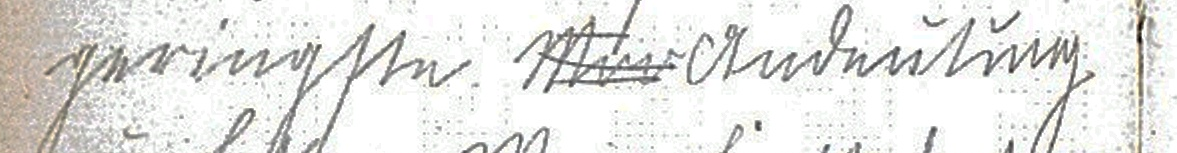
geringste Andeutung
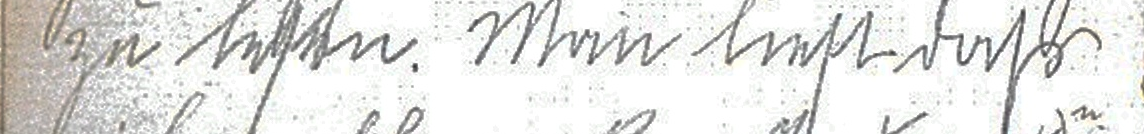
zu lesen. Man liest daß
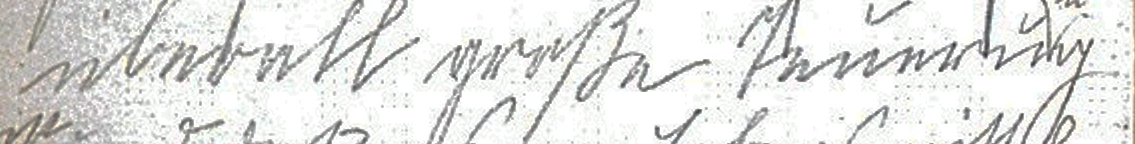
überall große Teuerung
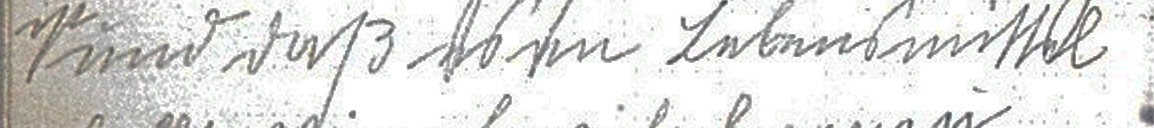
ist und daß es an Lebensmittel
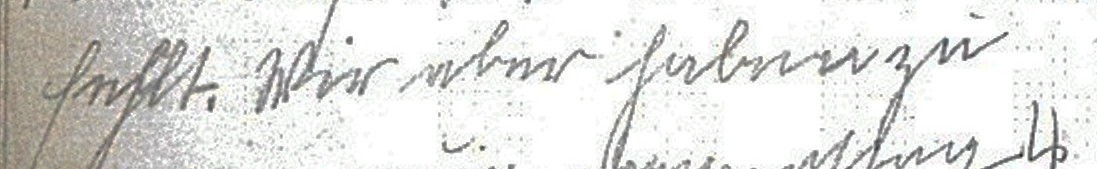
fehlt. Wir aber haben zu
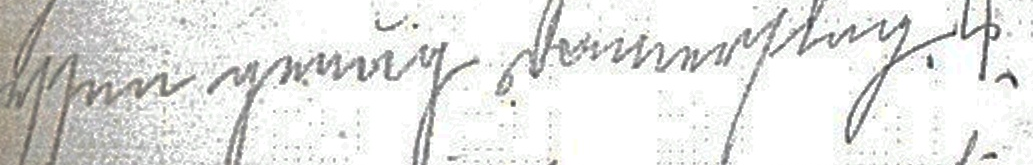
essen genug Donnerstag 4.
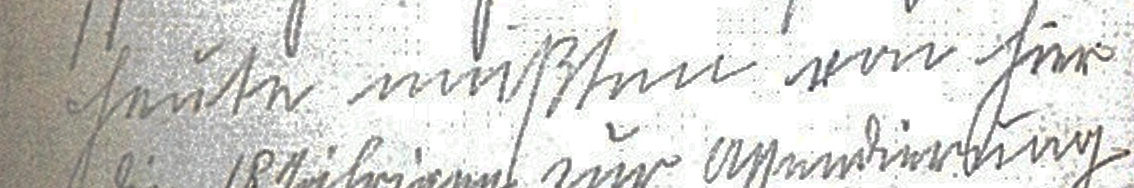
Heute mußten von hier
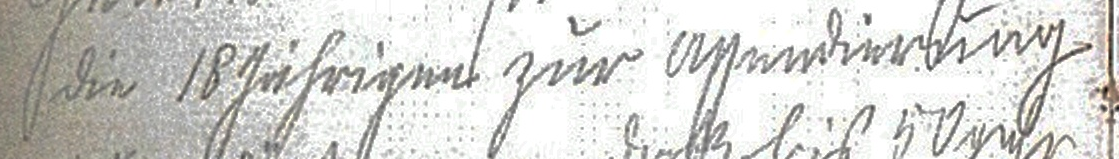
die 18jährigen zur Assendierung
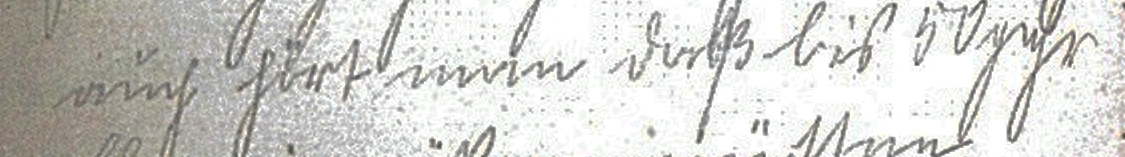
auch hört man, daß bis 50 Jahre
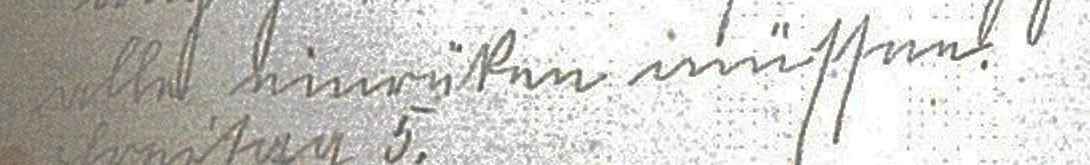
alle einrücken müssen.
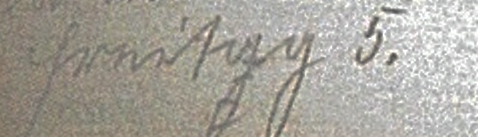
Freitag 5.
